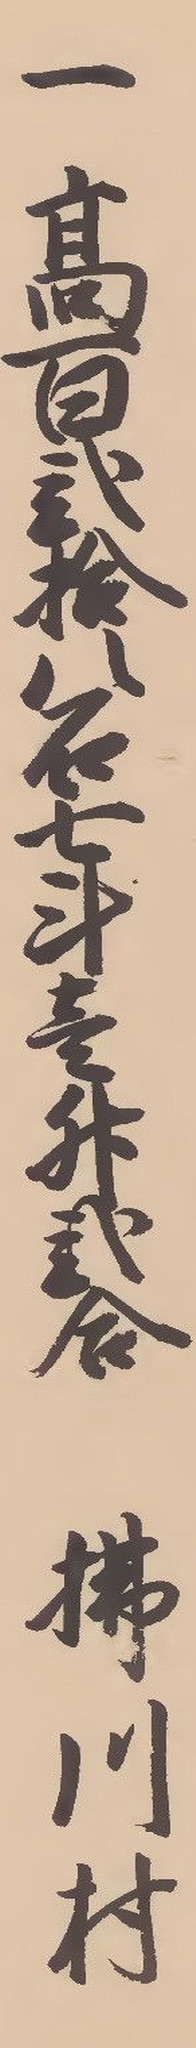一高百弐拾八石七斗壱升弐合払川村
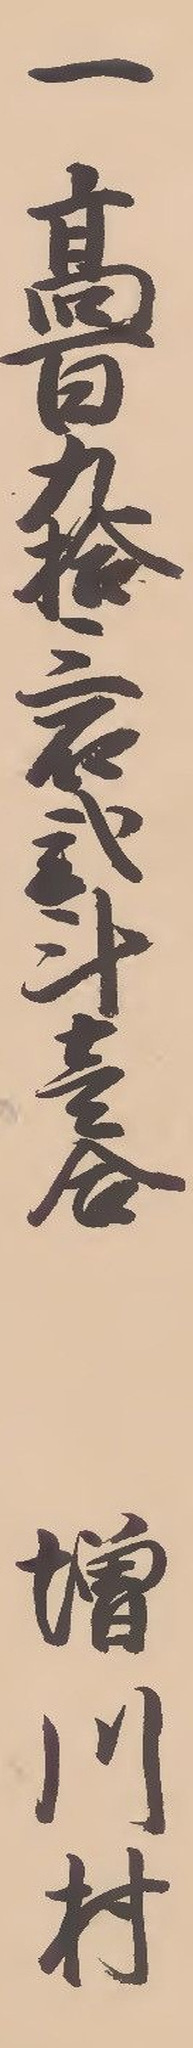一高百九拾三石弐斗壱合増川村
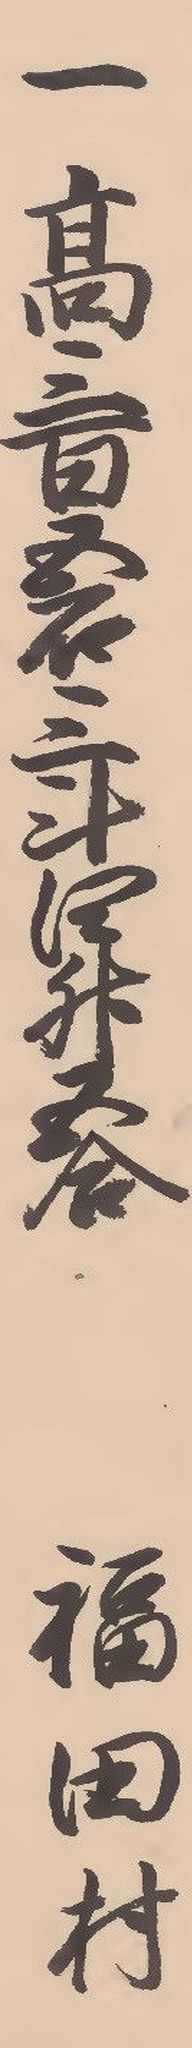一高三百五石三斗四升五合福田村
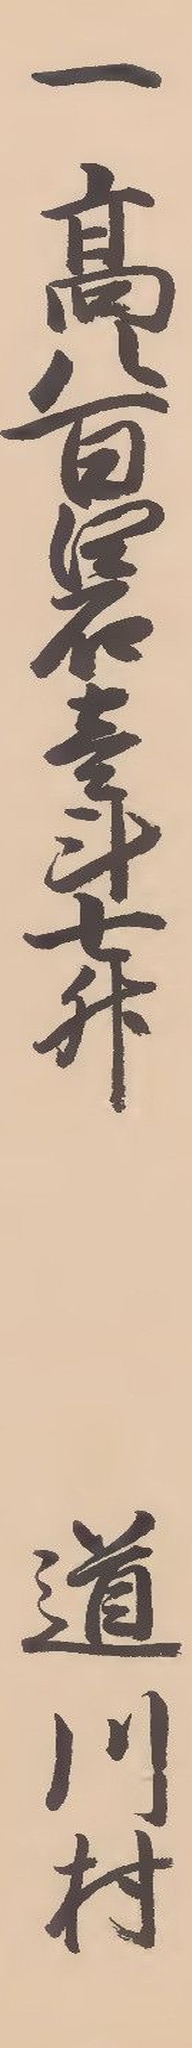一高八百四石壱斗七升道川村
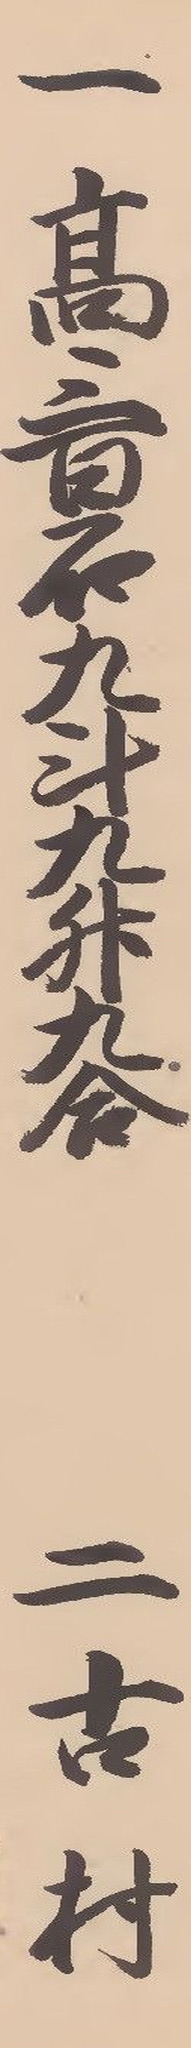一高三百石九斗九升九合二古村
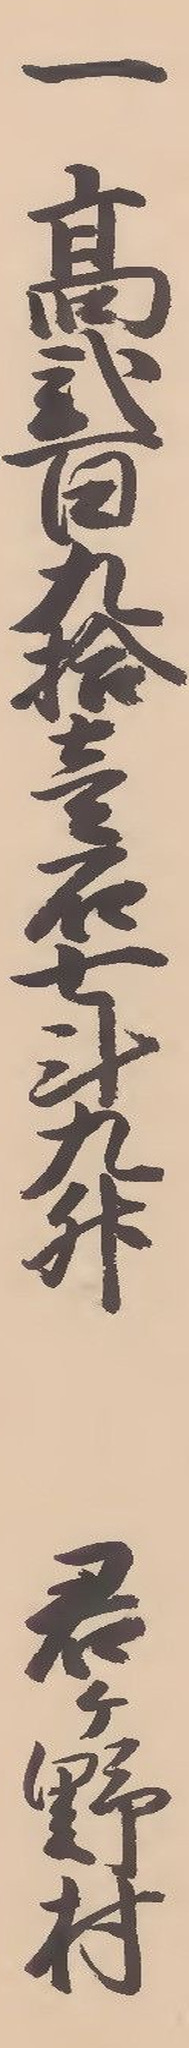一高弐百九拾壱石七斗九升君ヶ野村

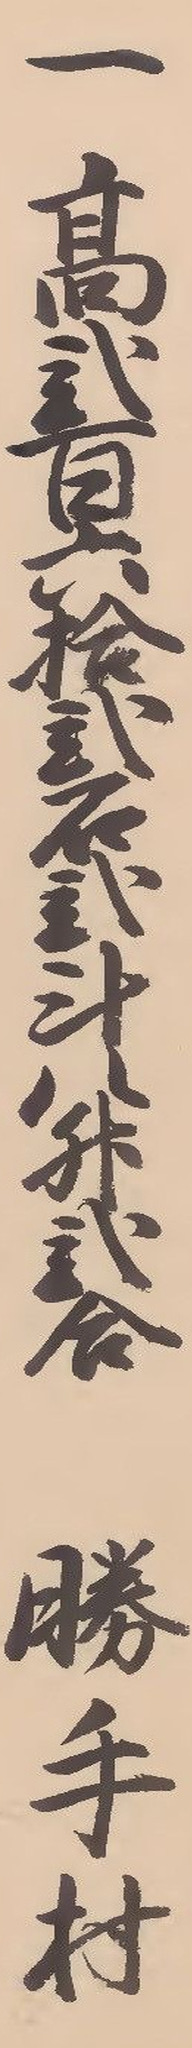一高弐百六拾弐石弐斗八升弐合勝手村
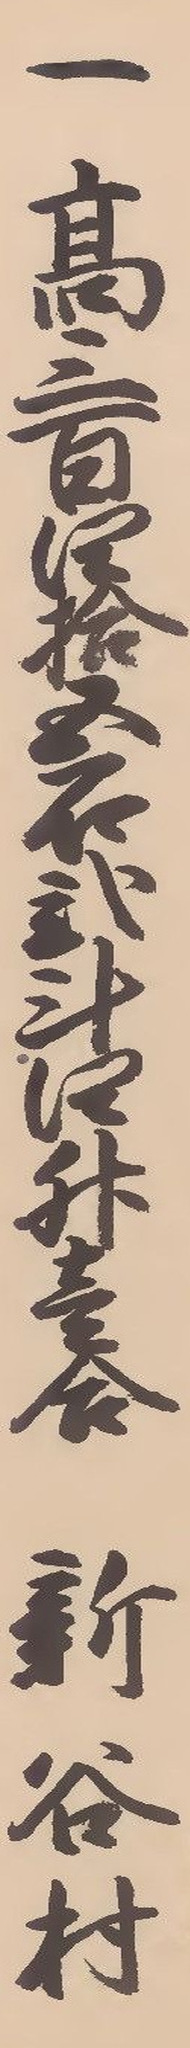一高三百四拾五石弐斗四升壱合新谷村
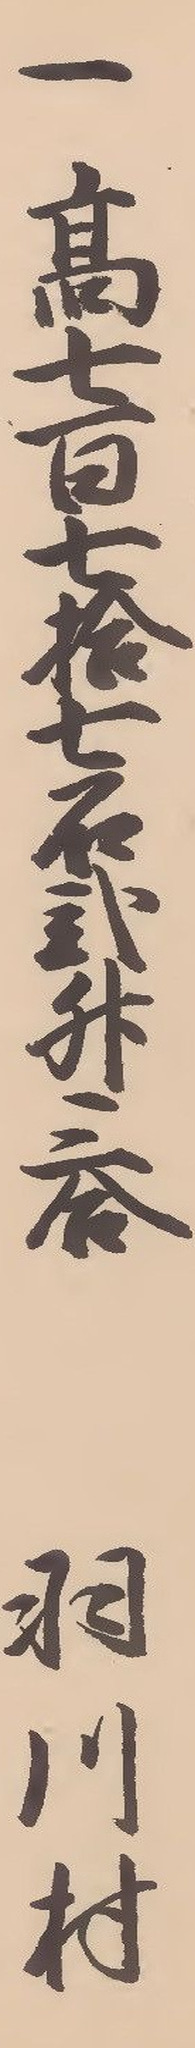一高七百七拾七石弐升三合羽川村
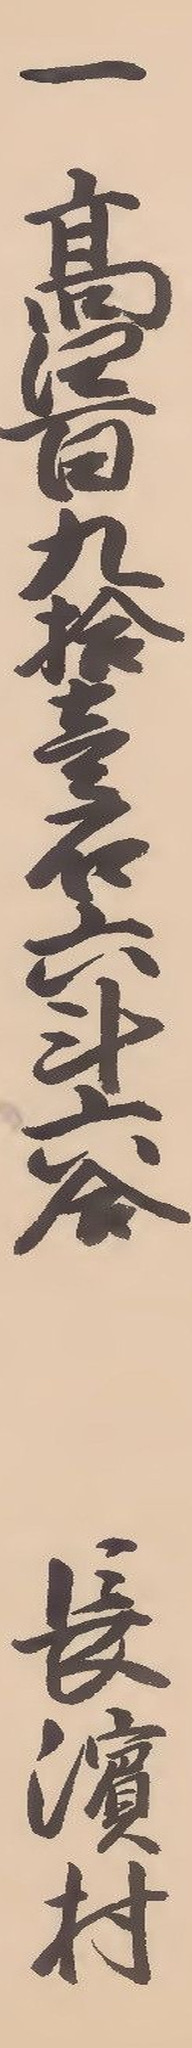一高四百九拾壱石六斗六合長浜村
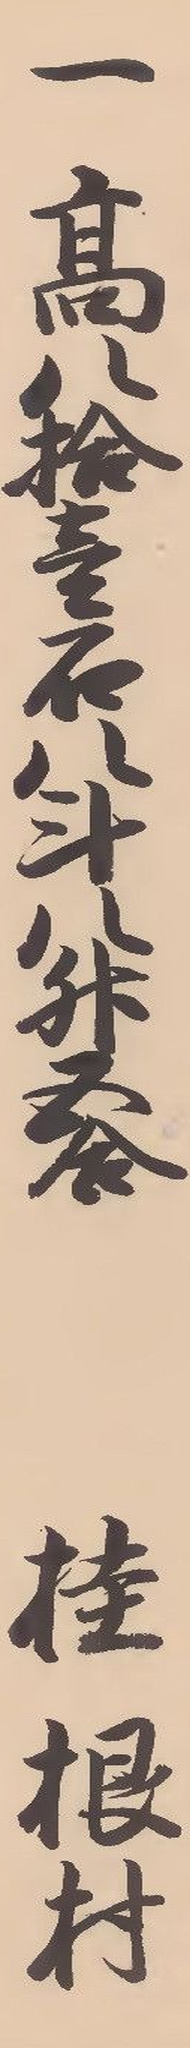一高八拾壱石八斗八升五合桂根村
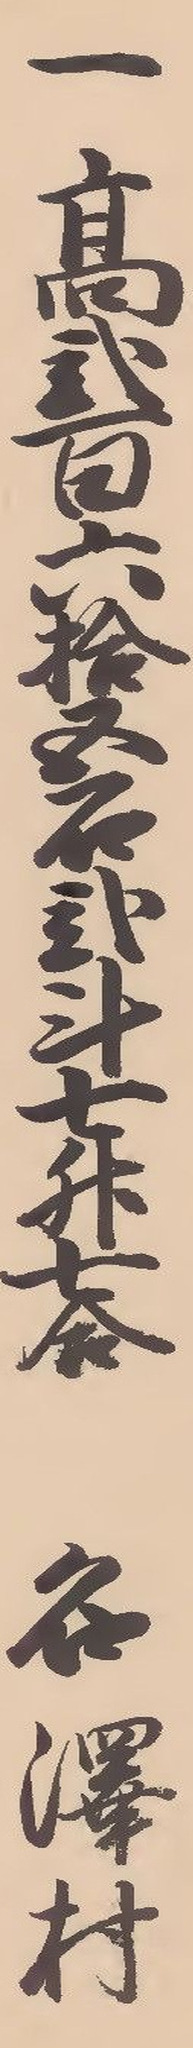一高弐百六拾五石弐斗七升七合名沢村
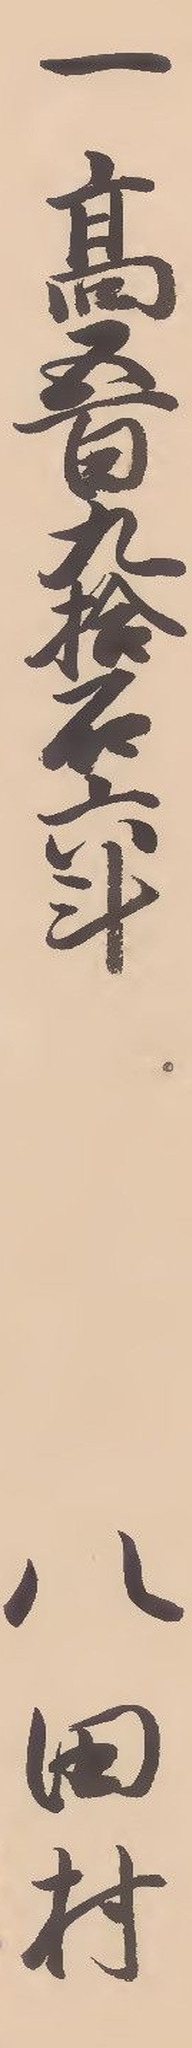一高五百九拾石六斗八田村
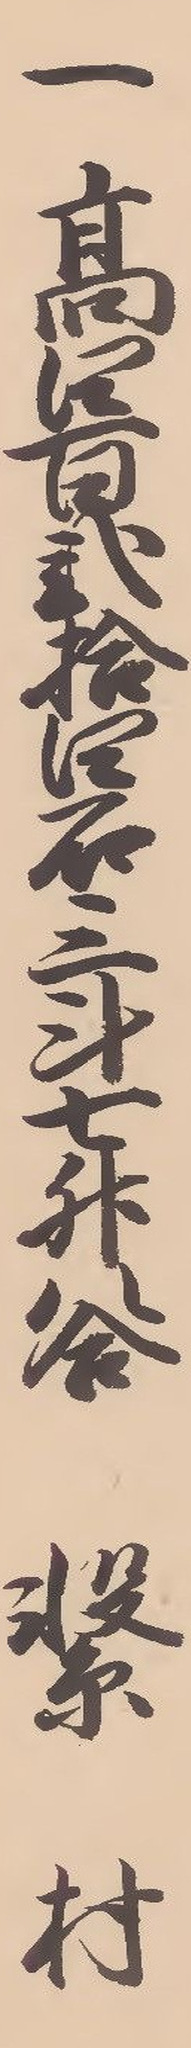一高四百弐拾四石三斗七升八合繋村

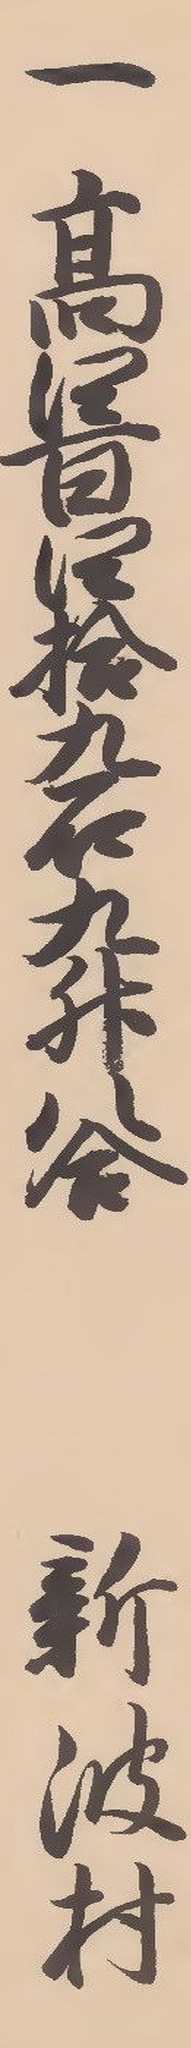一高四百四拾九石九升八合新波村
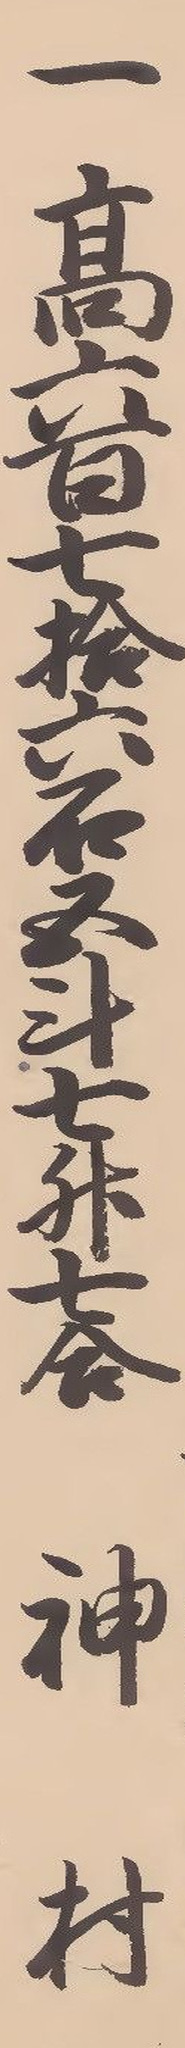一高六百七拾六石五斗七升七合神村
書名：出羽国郷帳　５
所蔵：国立公文書館 National Archives of Japan
